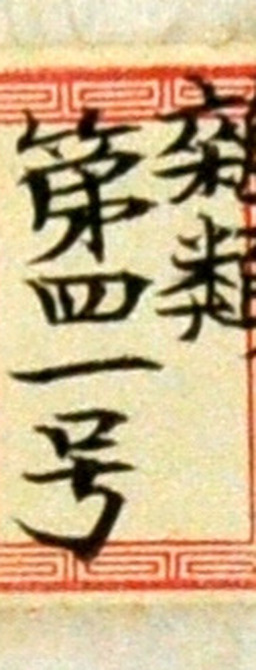第四一号

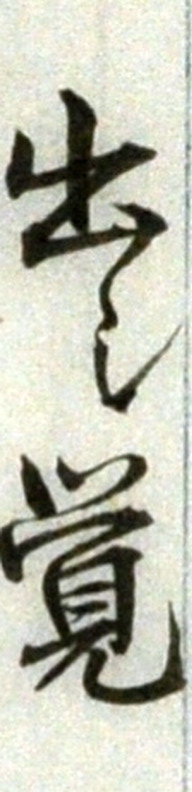出し覚
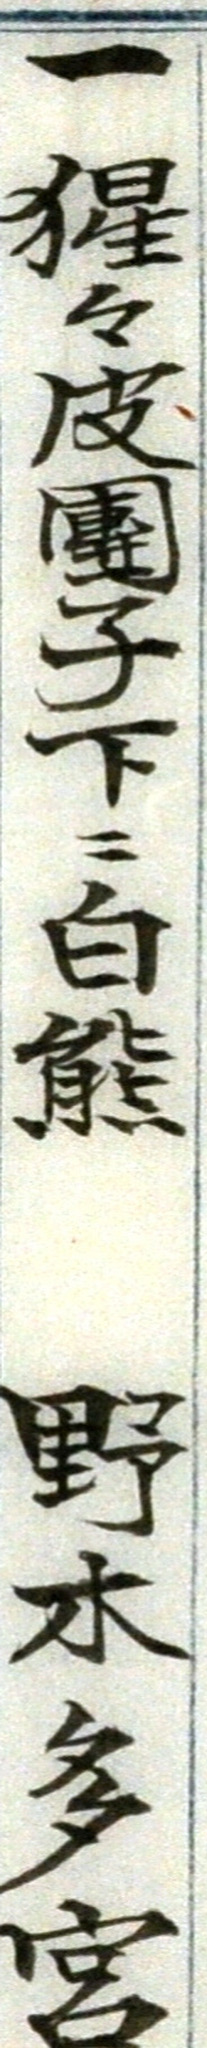猩々皮團子下ニ白熊野木多宮
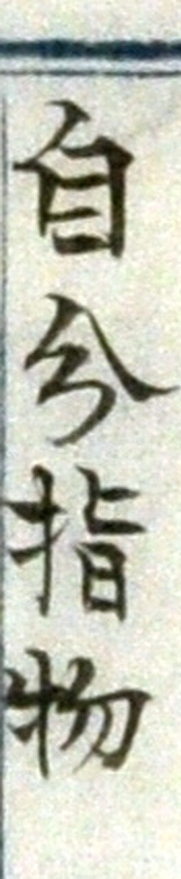自分指物
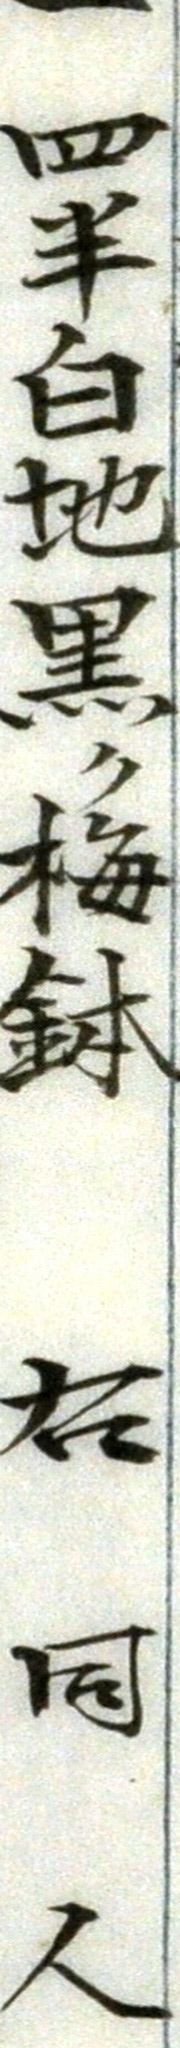一四半白地黒ノ梅鉢右同人
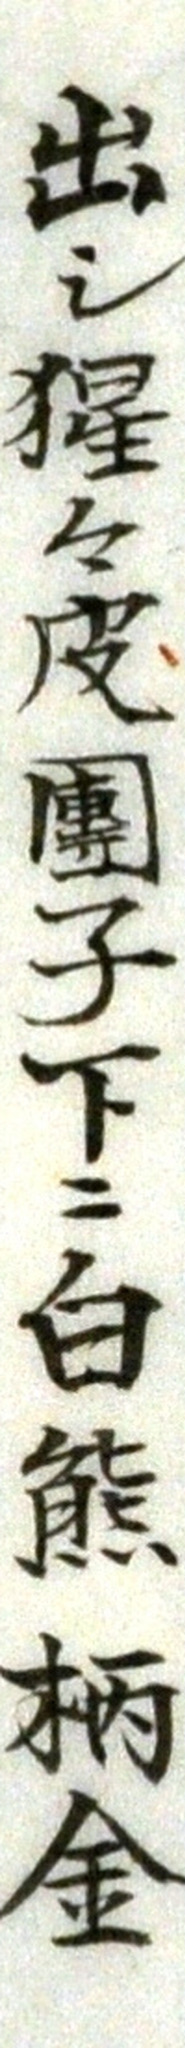出シ猩々皮團子下ニ白熊柄金
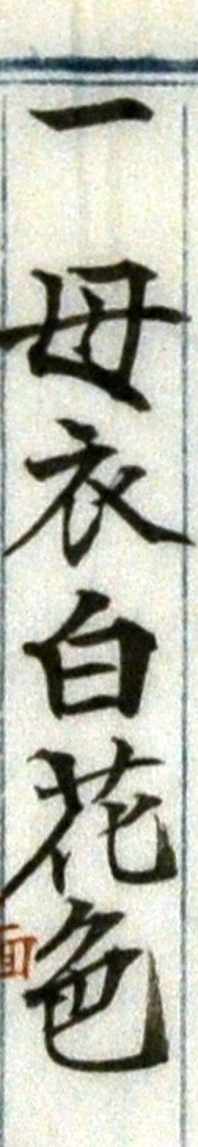一母衣白花色
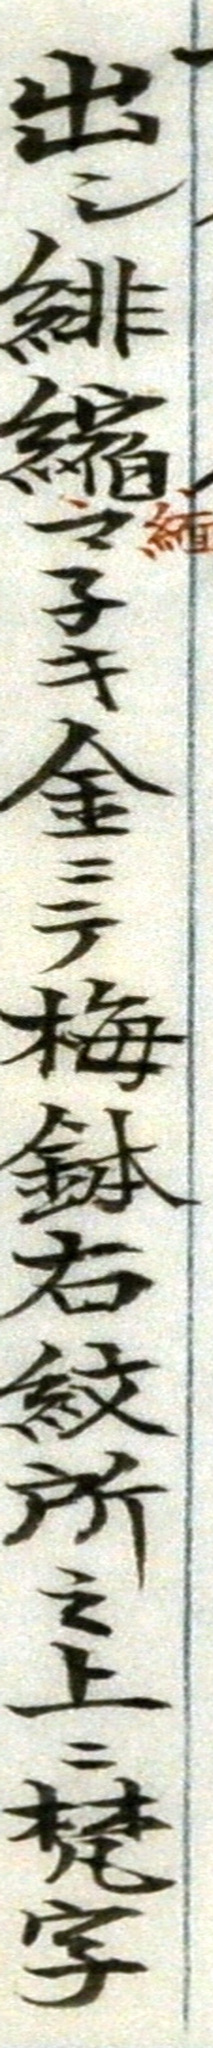出シ緋縮緬マ子キ金ニテ梅鉢右紋所之上ニ梵字
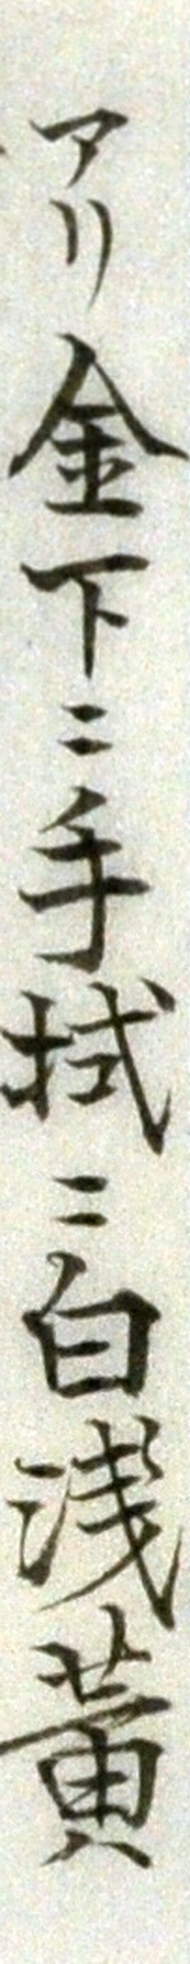アリ金下ニ手拭ニ白浅黄
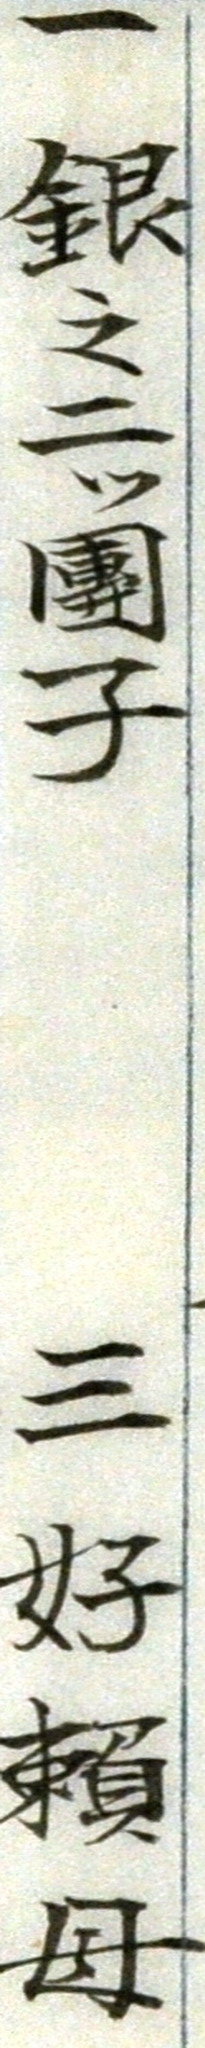一銀之二ツ團子三好頼母
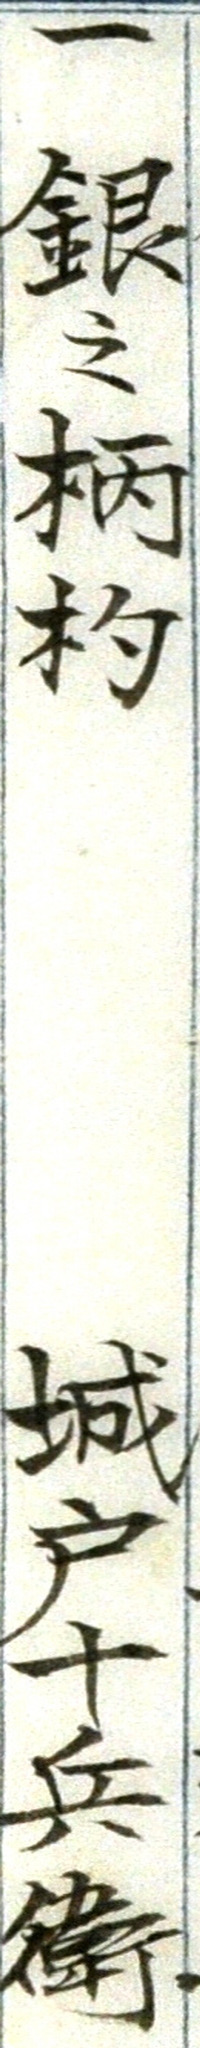一銀之柄杓城戸十兵衛

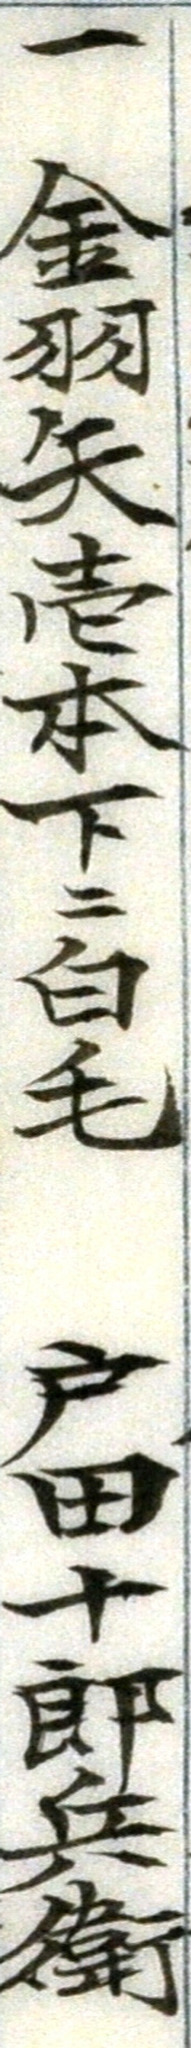金羽矢壱本下ニ白毛戸田十郎兵衛
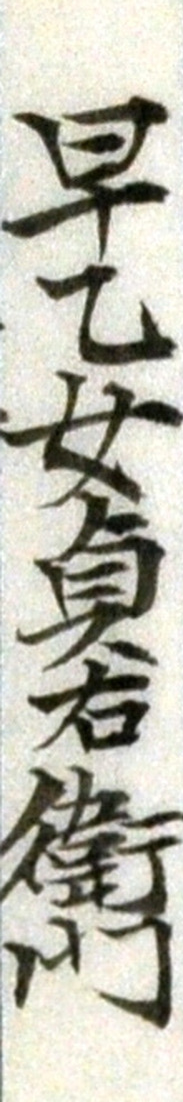一早乙女貞右衛門
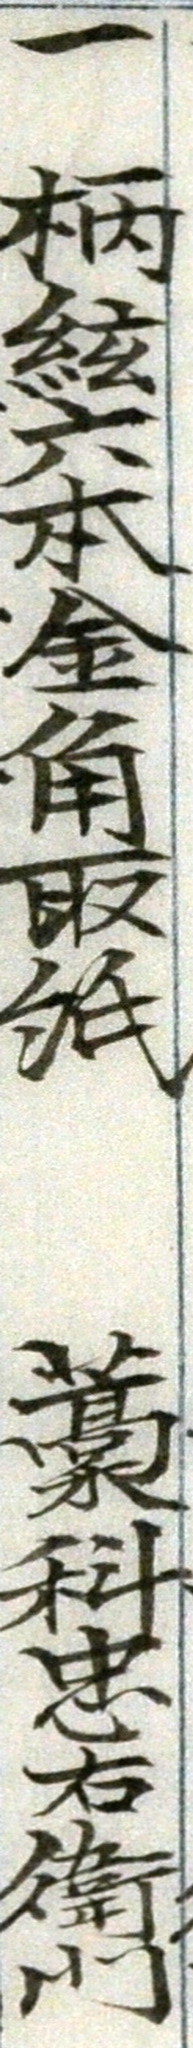一柄絃六本金角取紙藁科忠右衛門
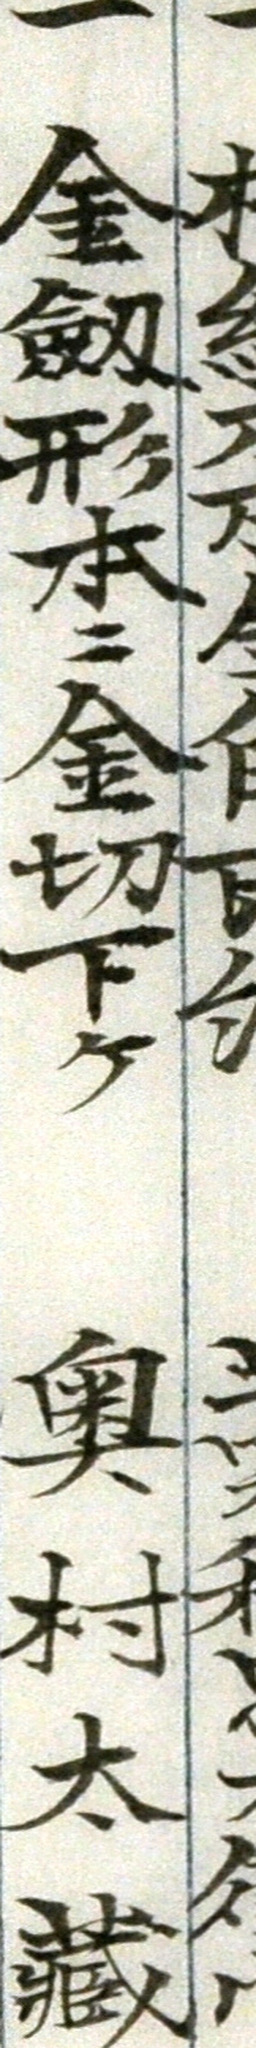一金劔形本に金切下ケ奥村太藏

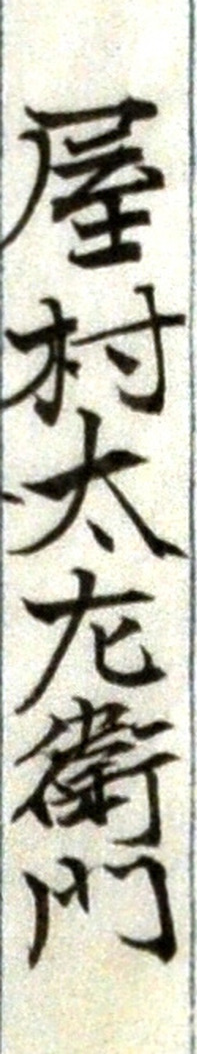一屋村太左衛門
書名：江戸高遠出シ品附之写
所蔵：伊那市立高遠町図書館・合同会社AMANE
